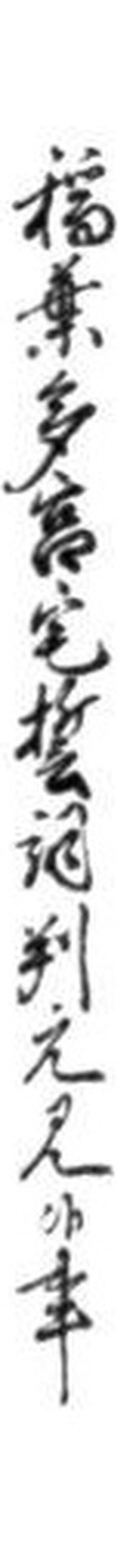稲葉多宮宅誓詞判元見候事
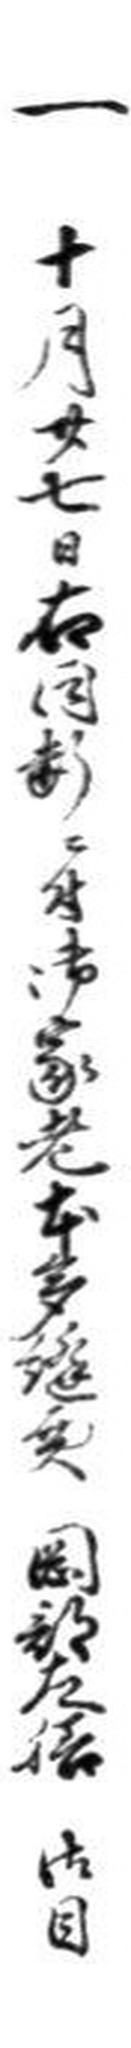一十月廿七日右同断ニ付御家老本多縫殿岡部左膳御目
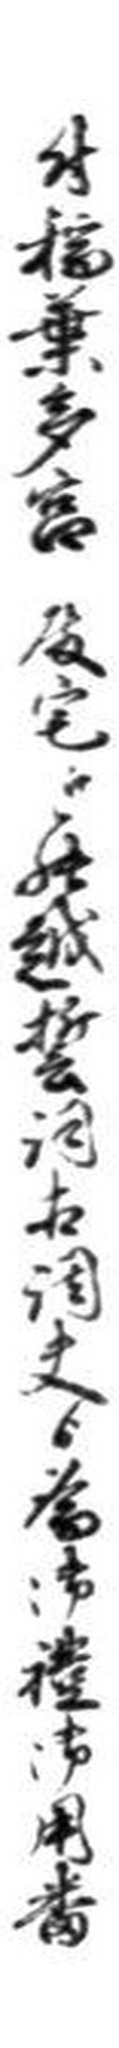付稲葉多宮殿宅江罷越誓詞相調夫ゟ為御礼御用番
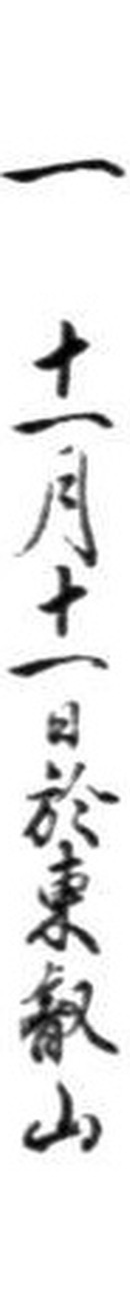一十一月十一日於東叡山
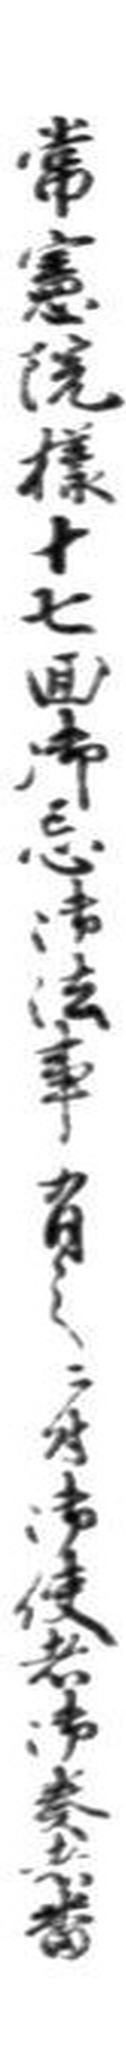常憲院様十七回御忌御法事有之ニ付御使者御奏者番
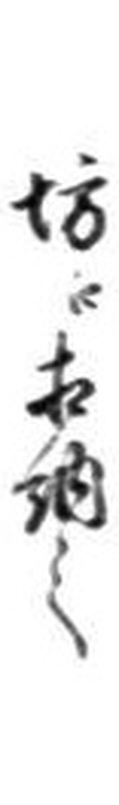坊江相納之
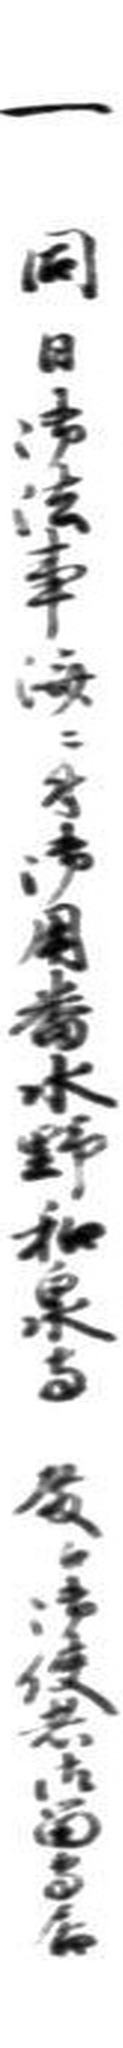一同日御法事済ニ付御用番水野和泉守殿江御使者御留守居
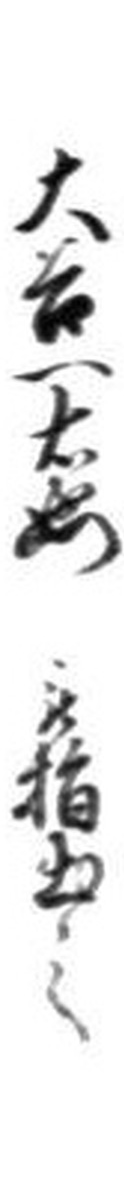大谷一右衛門被指出之
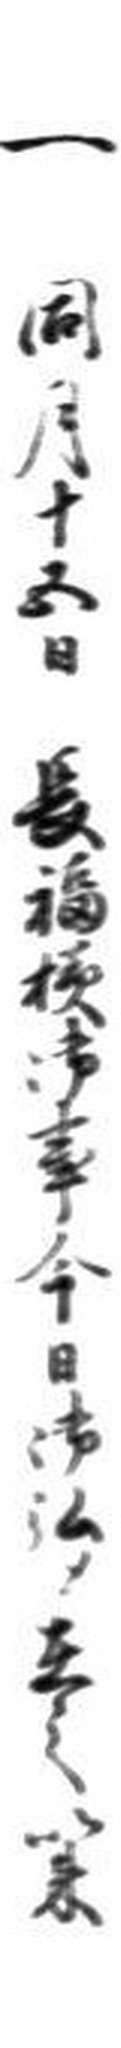一同月十五日長福様御事今日御弘メ在之以来
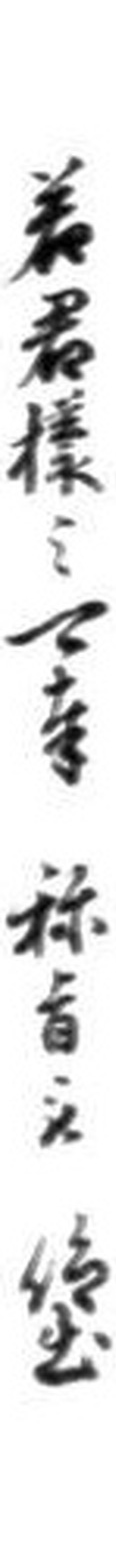若君様与可奉称旨被仰出
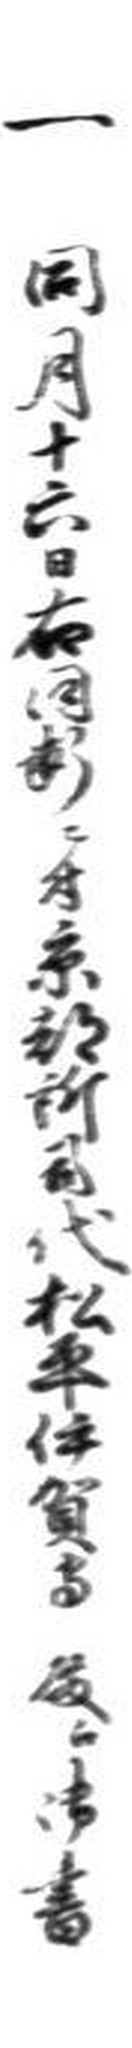一同月十六日右同断ニ付京都所司代松平伊賀守殿江御書
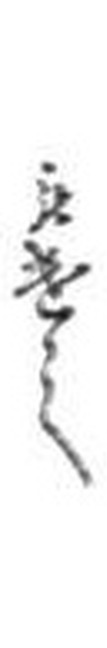被遣之
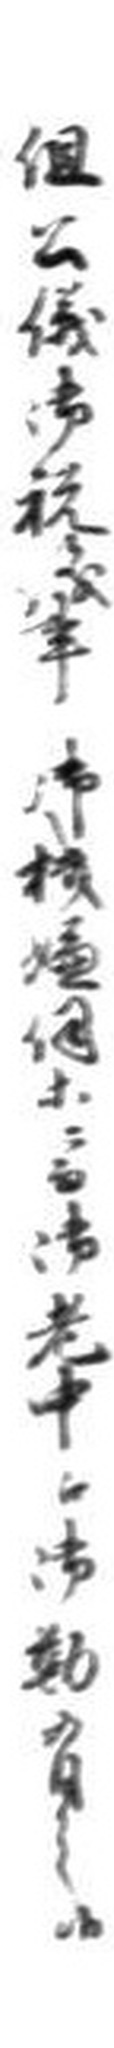但公儀御祝儀事御機嫌伺等ニ而御老中江相勤有之候

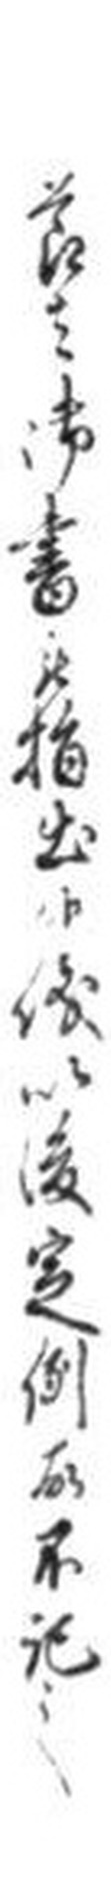節之御書被指出候儀以後定例故不記之
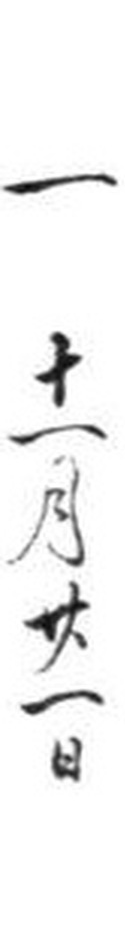一十一月廿一日
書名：家譜 三十八 宗矩公 従享保九年五月到享保九年十二月
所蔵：福井県文書館 Fukui Prefectural Archives
